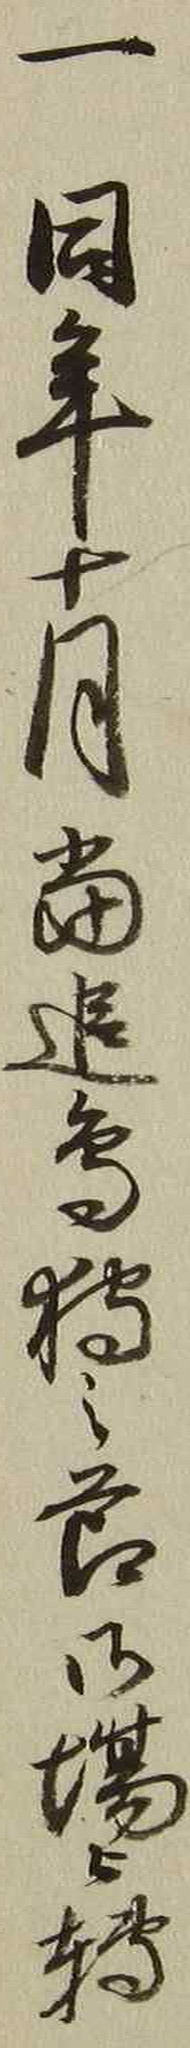一同年十月当追鳥狩之節御場被転
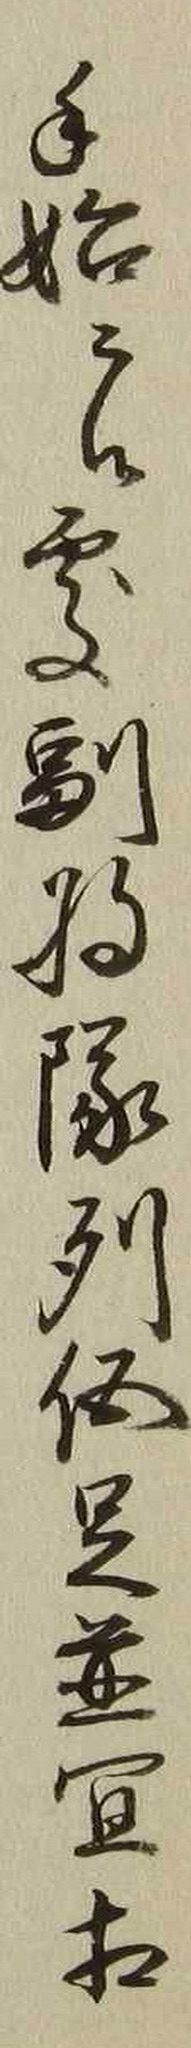手始に候処副将隊列伍足並宜相
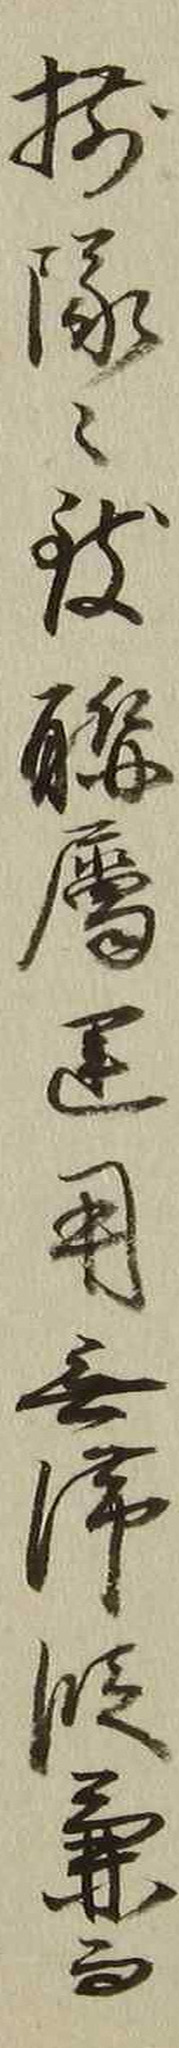揃隊々致聯属運用無滞段兼而
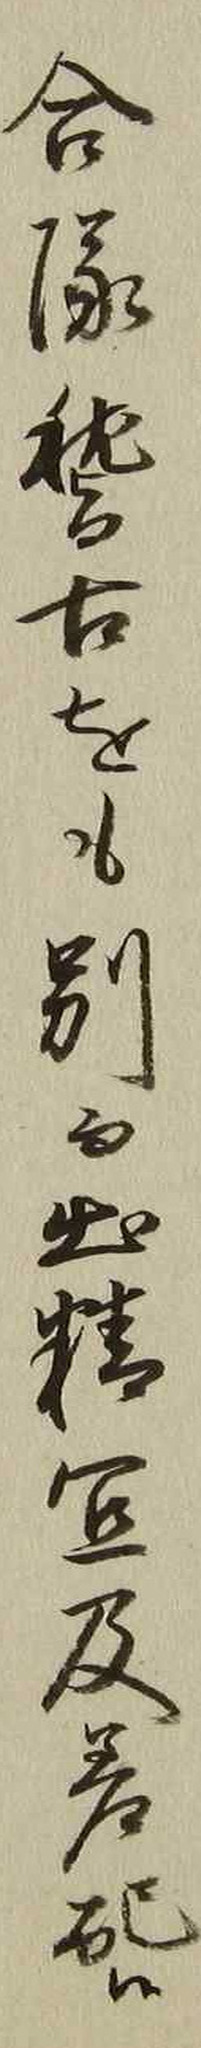合滞稽古をも別而出精宜及差配候
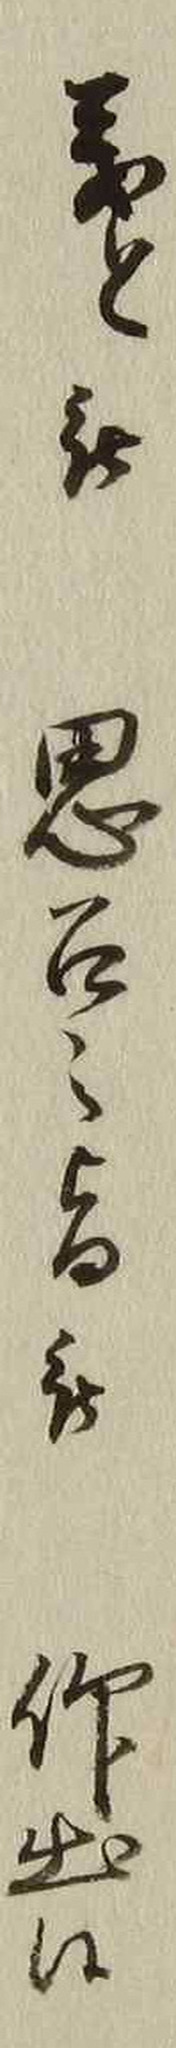義と被思召之旨被仰出候
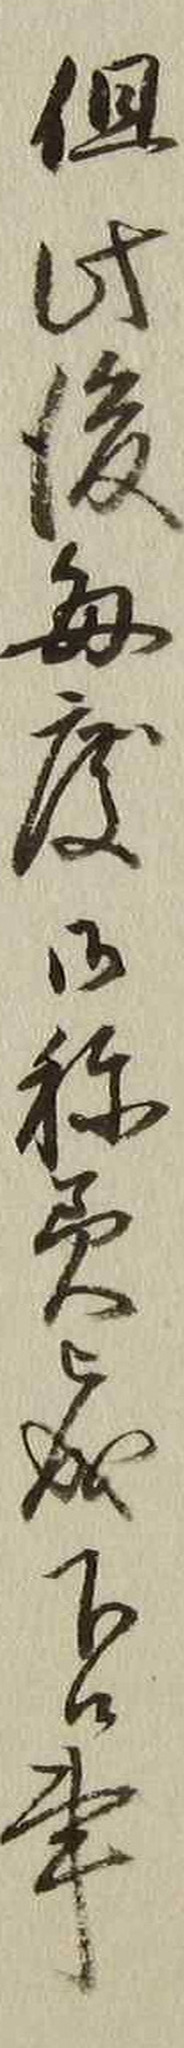但此後毎度御称美被成下候事
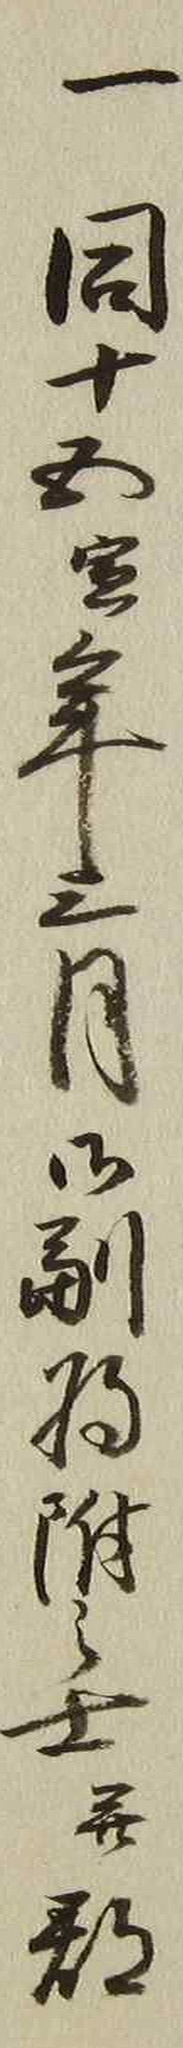一同十五寅年三月御副将附之士并郡
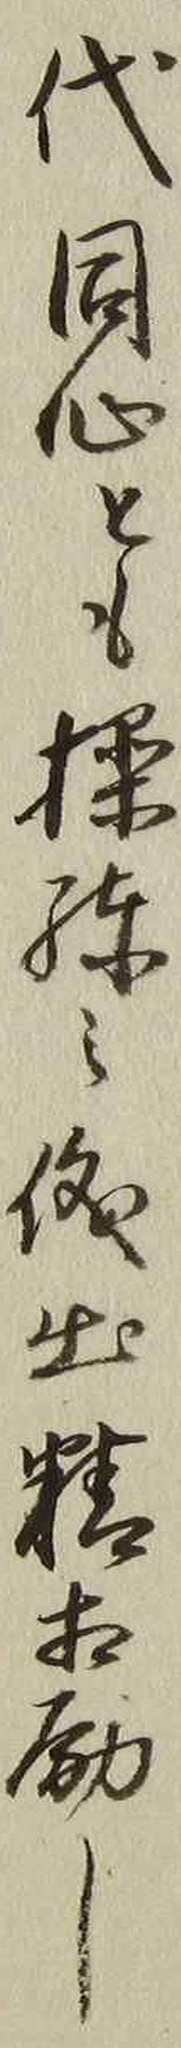代同心とも操練之儀出精相励し
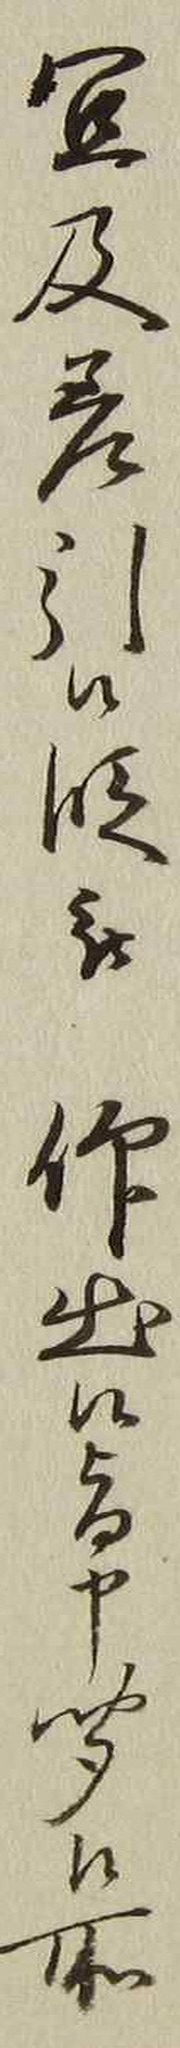宜及差引候段被仰出候旨申聞候所
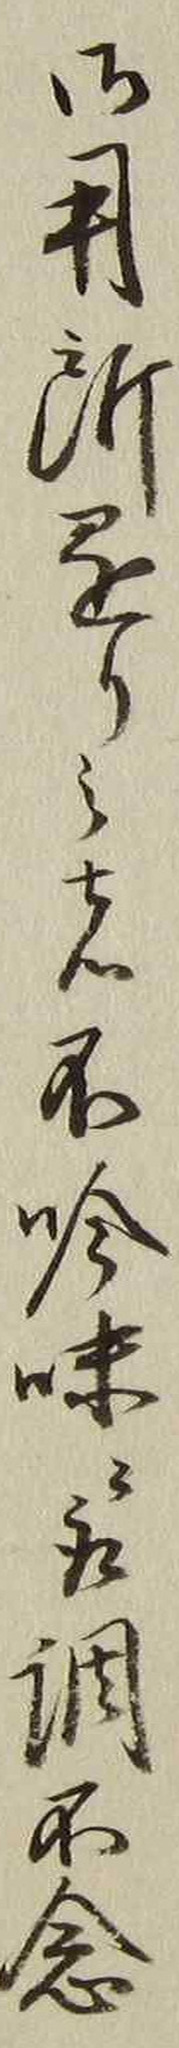御用所懸りの者不吟味に取調不念
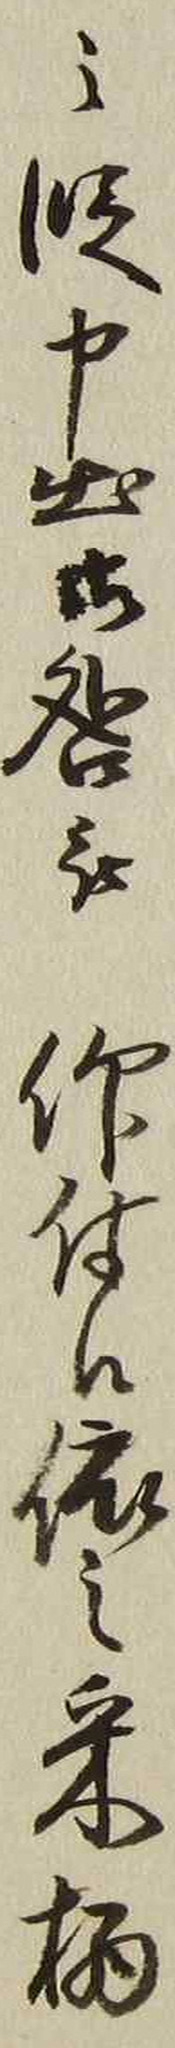之段申出御咎被仰付候依之采柄
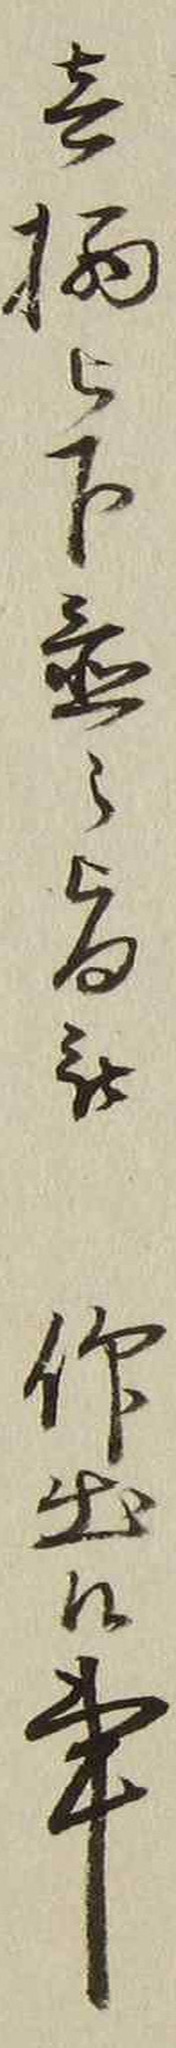壱柄被下置之旨被仰出候事
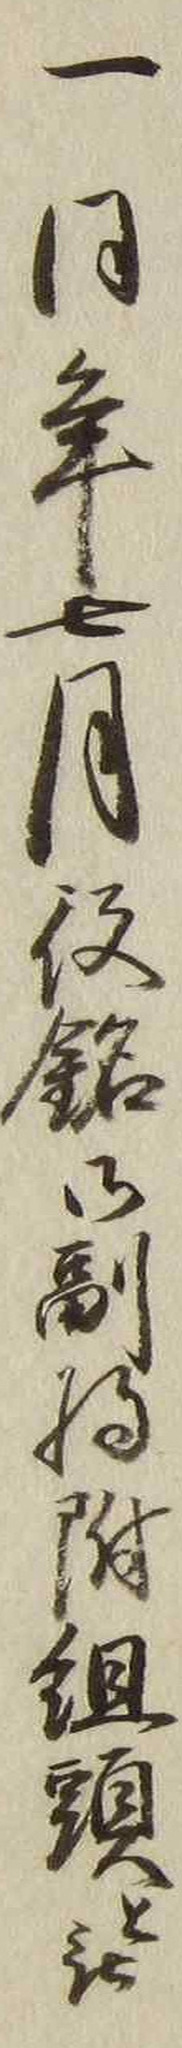一同年七月役銘御副将附組頭と被
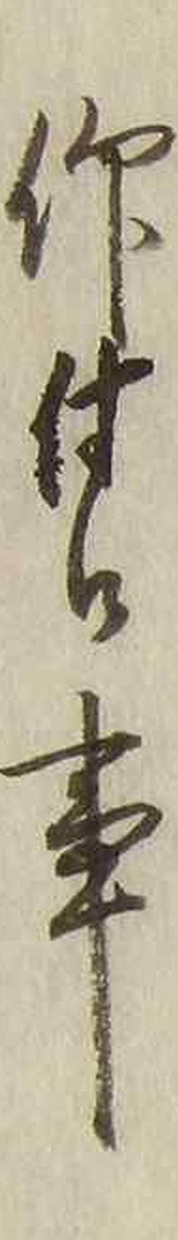仰付候事

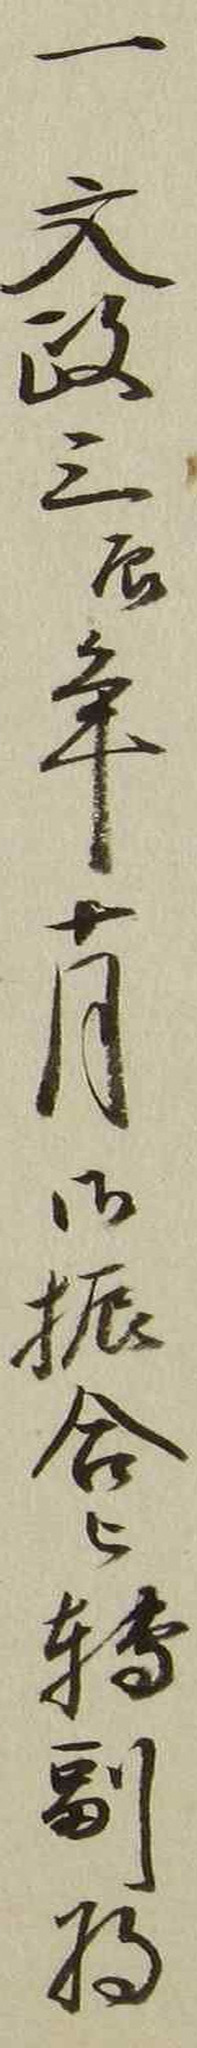一文政三辰年十月御振合被転副将
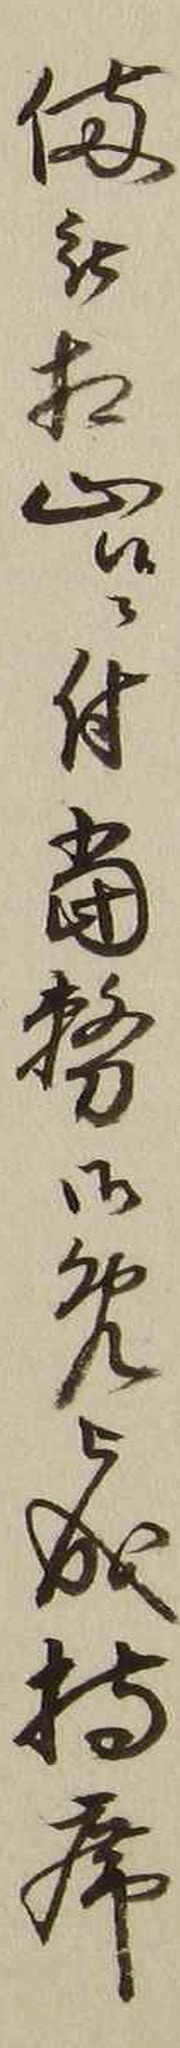備被相止候に付当務御免被成持席
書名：諸士系譜　巻之133　た之部9
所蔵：会津若松市立会津図書館
